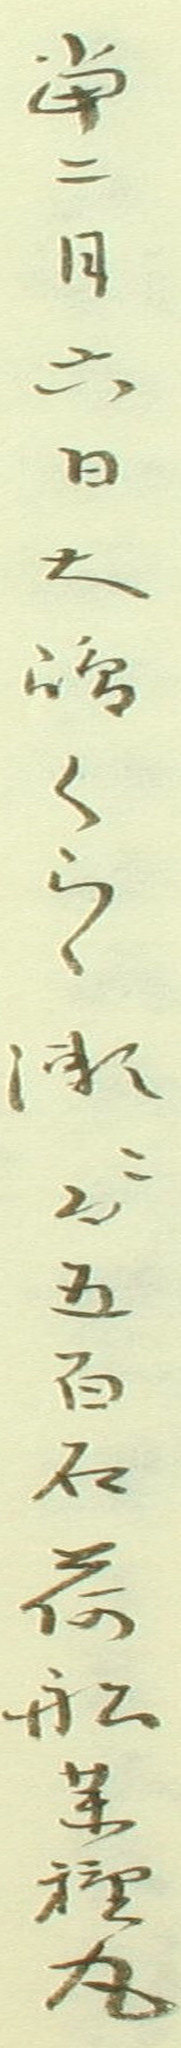当二月六日大嶋くらら瀬に而五百石荷船薬種丸
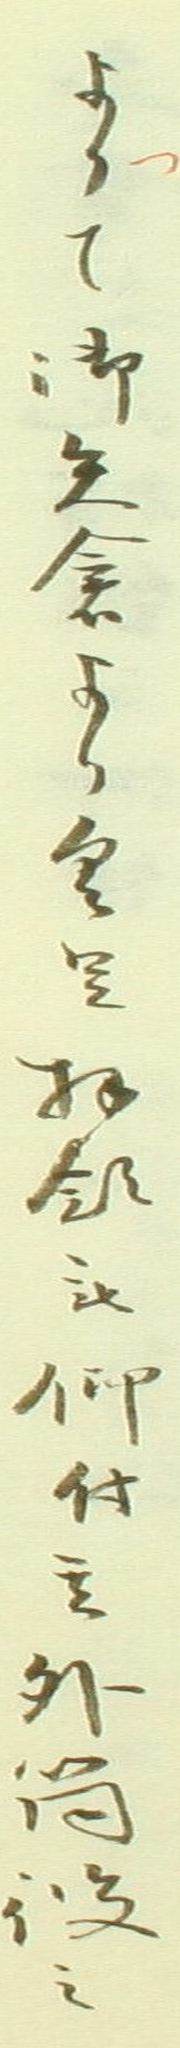よ？て御矢倉より具足拝領被仰付其外筒役之
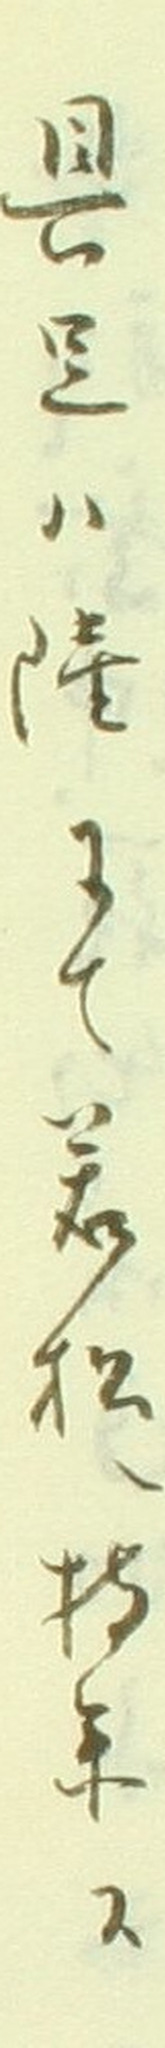具足は陸にて若松へ持参す
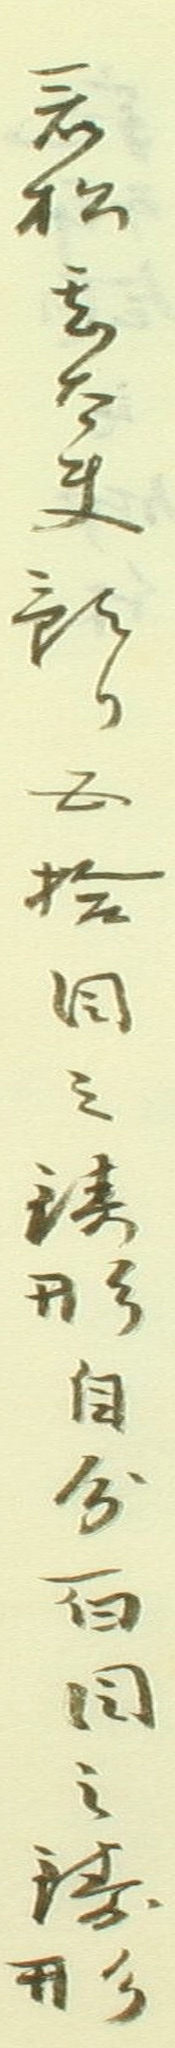一若松甚太夫預り五拾目之鋳形自分壱百目之鋳形
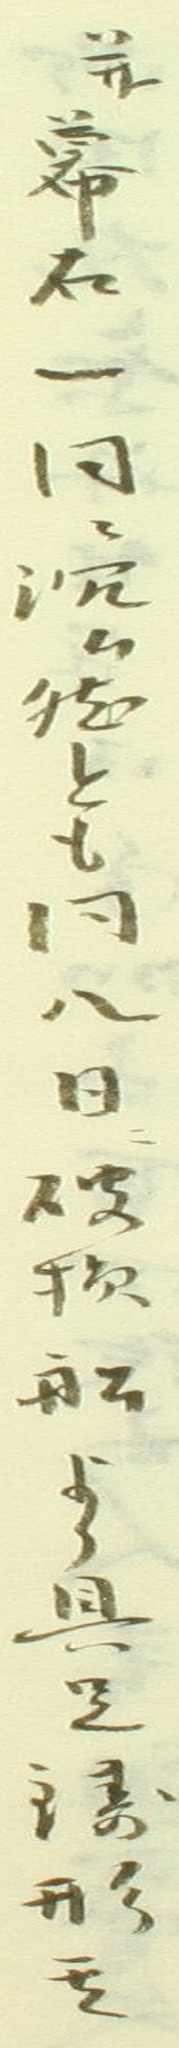並幕右一同に沈む然とも同八日破損船より具足鋳形其
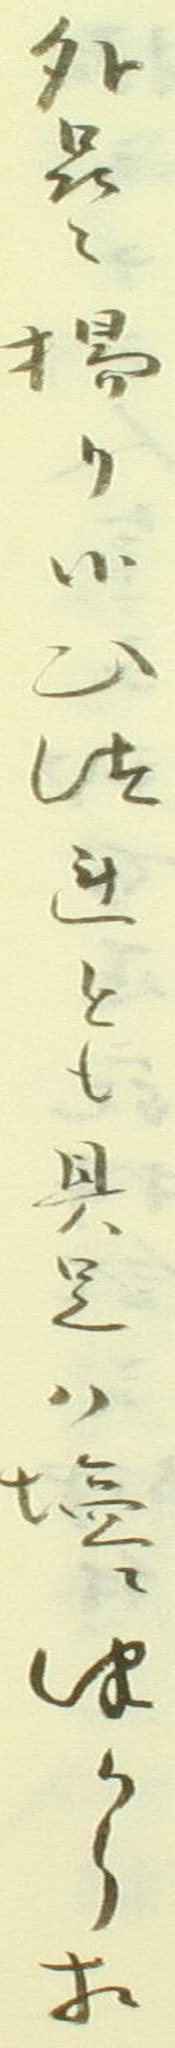外品々揚り候ひつれとも具足は塩につかり相
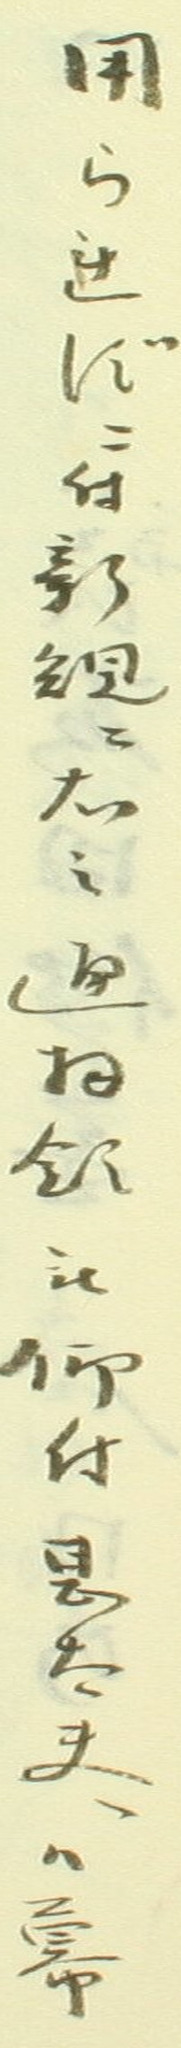用られずに付新規に右之通拝領被仰付甚太夫へは幕
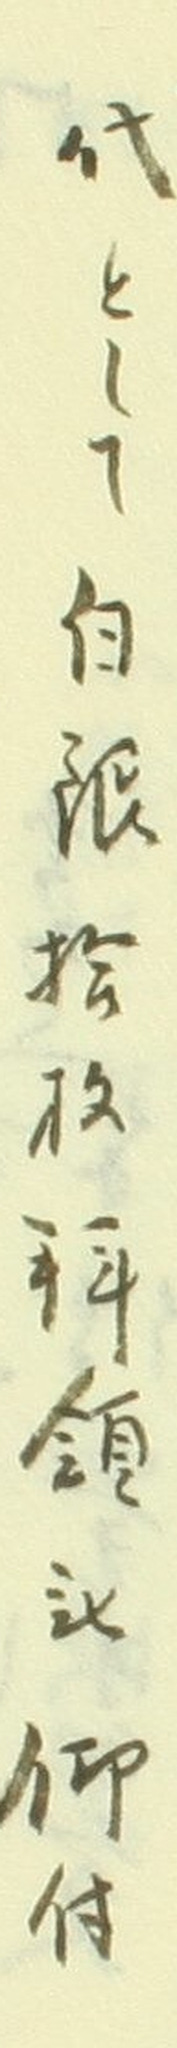代として白銀拾枚拝領被仰付
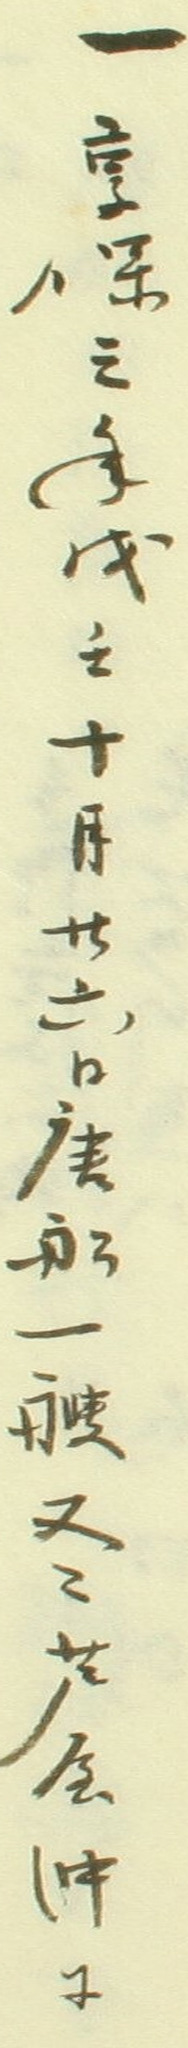一享保三年戌壬十月廿六日唐船一艘又又芦屋沖に
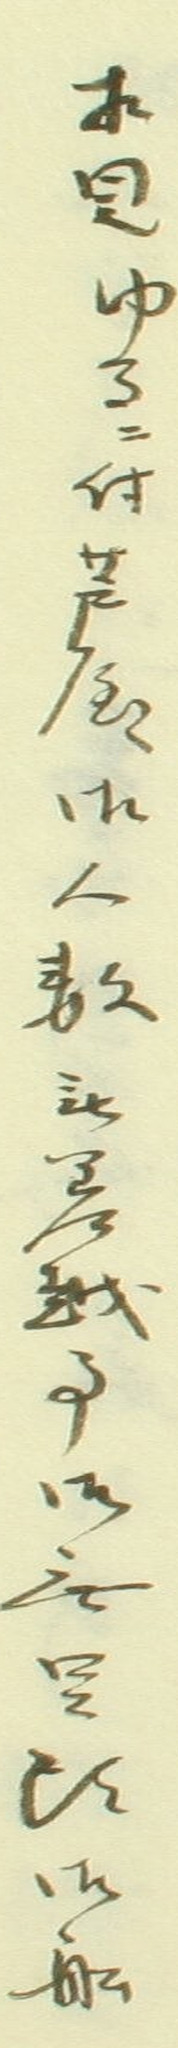相見ゆるに付芦屋へ御人数被差越事御無足頭御船
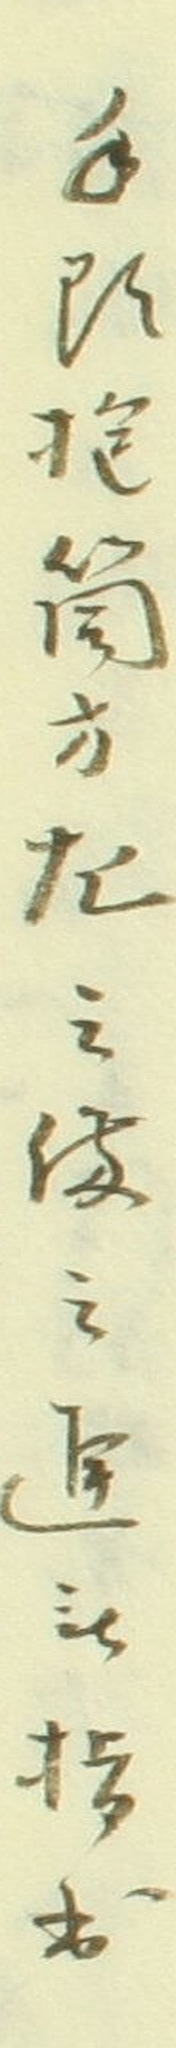手頭抱筒方左之備之通被指出

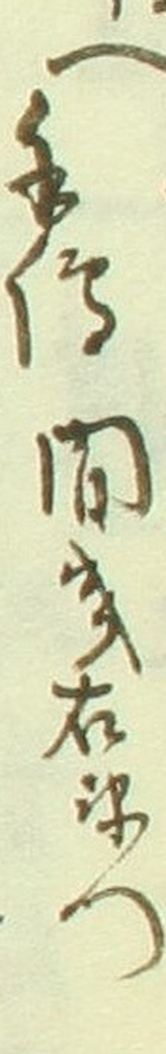手伝間義右衛門
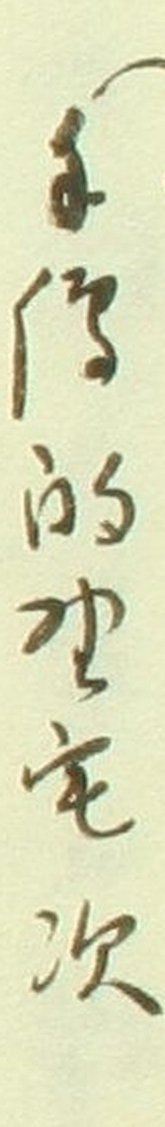手伝的野宅次
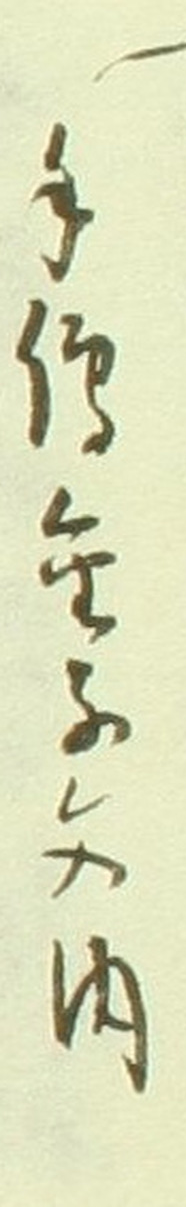手伝金子文内
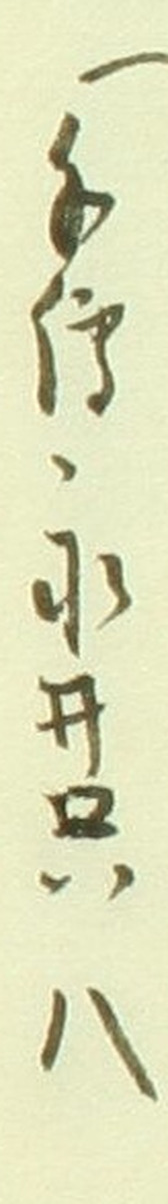手伝永井只八
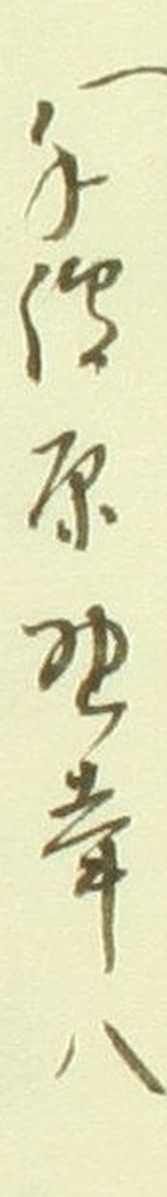手伝原野幸八
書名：唐船漂流記 三
